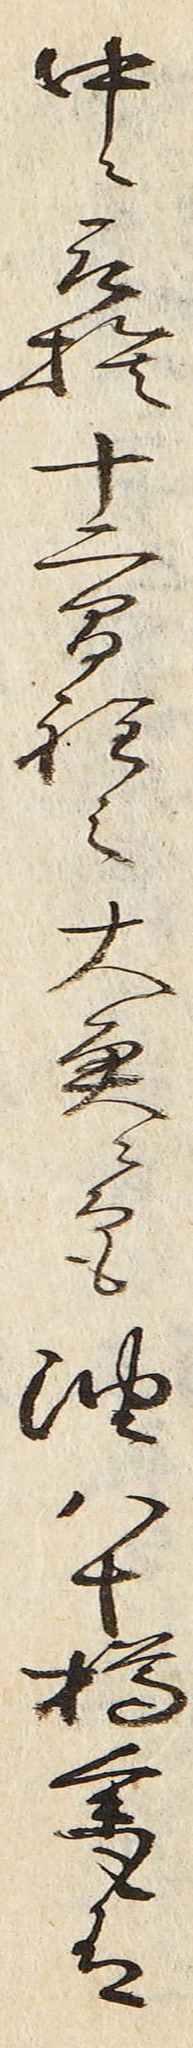中に取捨十二間程之大魚に而も油八十樽余も有
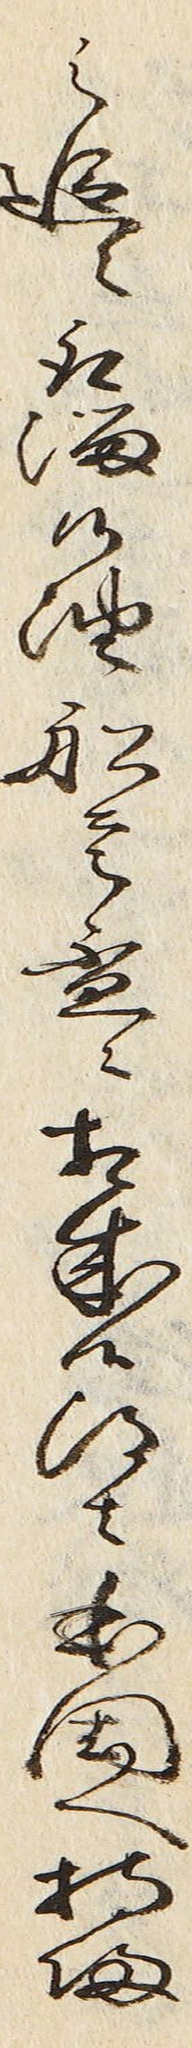之追々取溜候油船に壱盃に相成候得は本国へ持帰
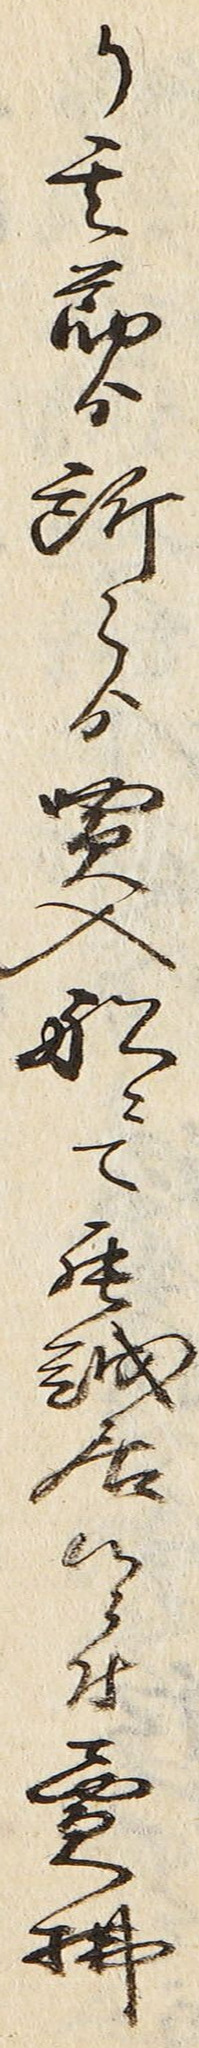り其節ゟ所々ゟ買入船にて罷越居候に付売払
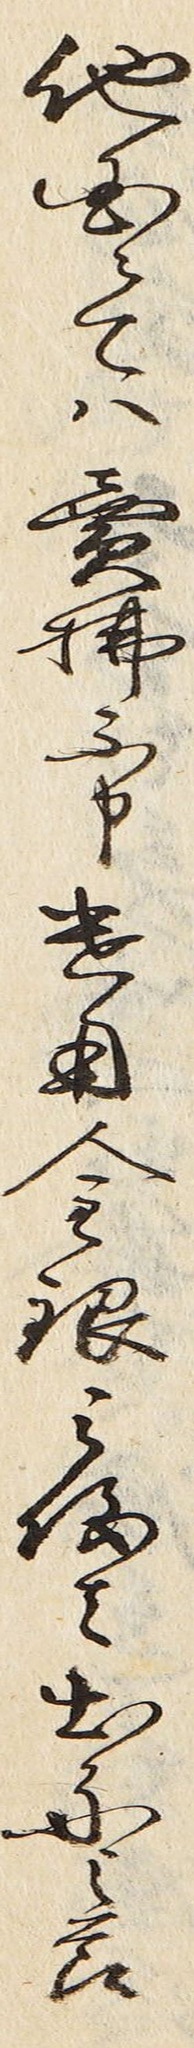他国にては売払不申遣用金銀之儀は出舟之節
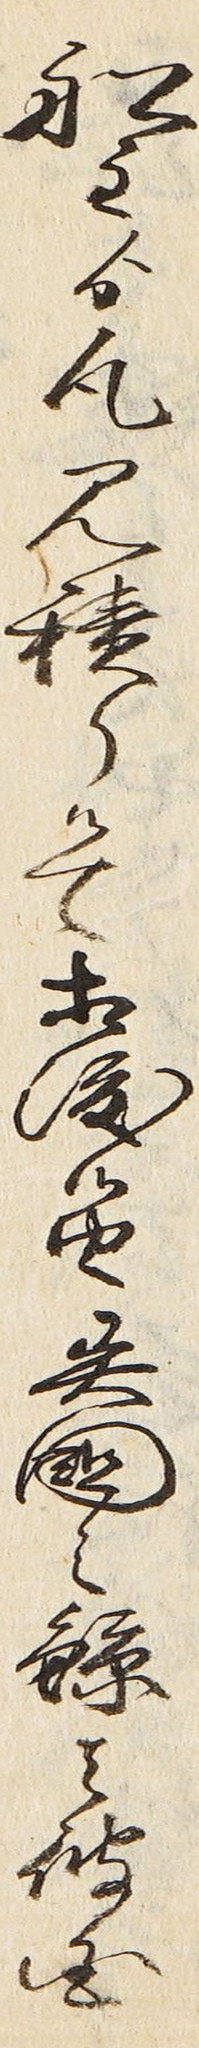船主ゟ凡見積り候て相渡候由異国之鯨は彼国
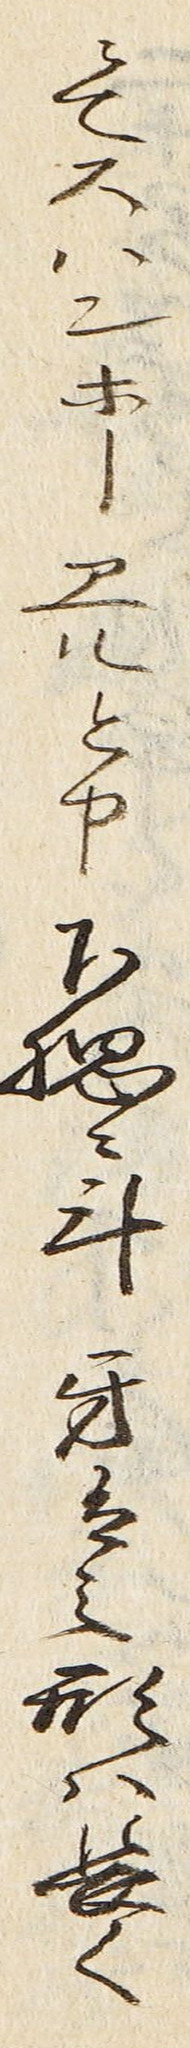にてスハンホーエルと申下に計牙有之形は長く
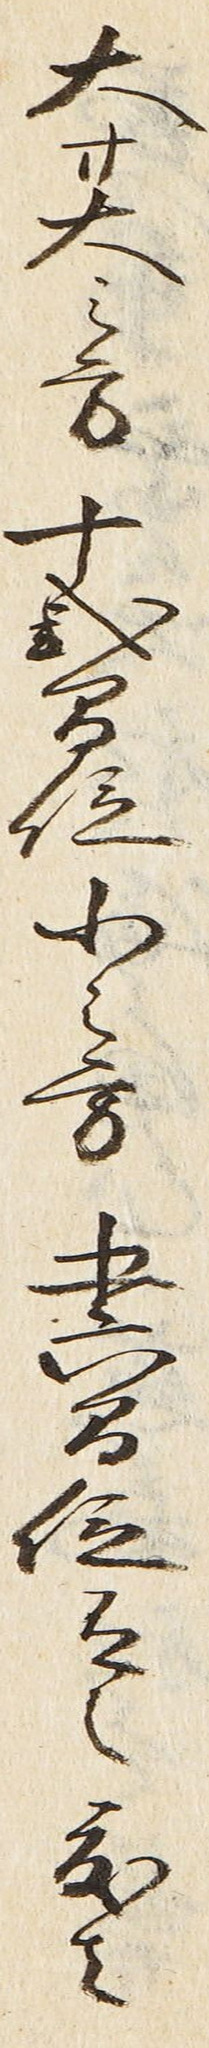大さ大之方十弐間位小之方五六間位有之夏は
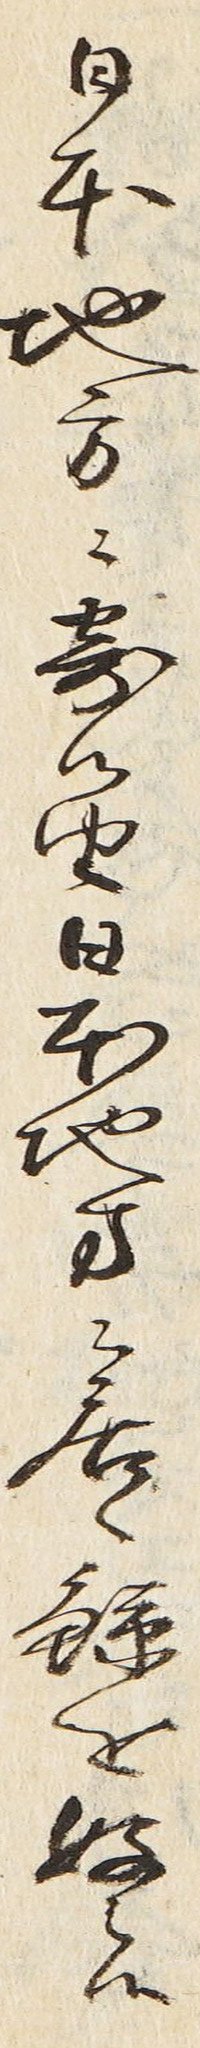日本地方に寄候由日本地方に居候鯨を好み候
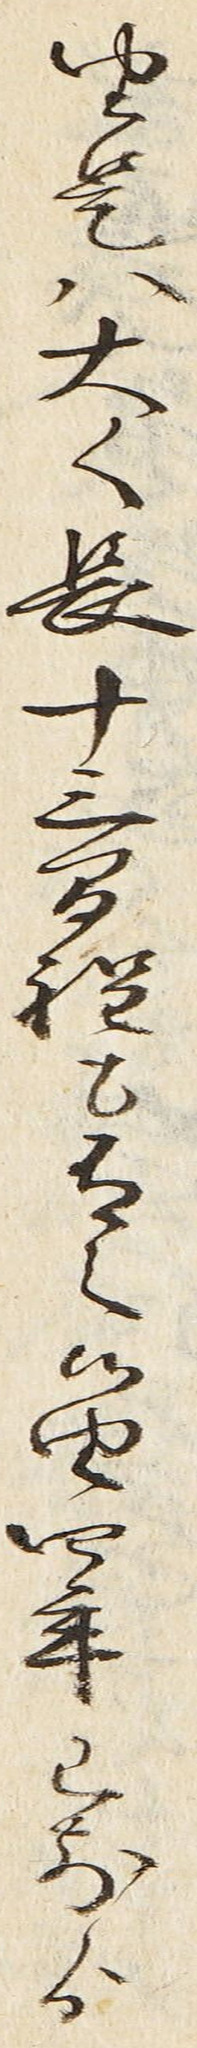由是は大く長十三間程も有之候由四年已前ゟ
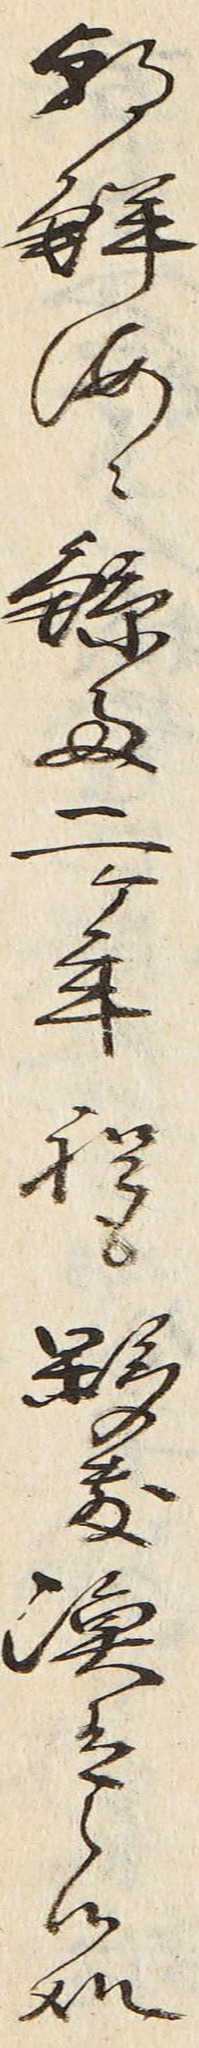朝鮮海に鯨多二ヶ年程も夥敷漁有之候処
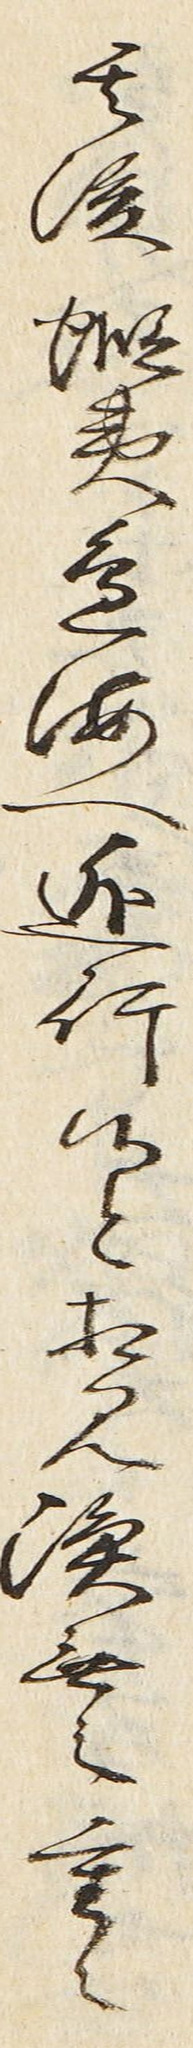其後蝦夷島海へ逃行候と相見漁無之重々
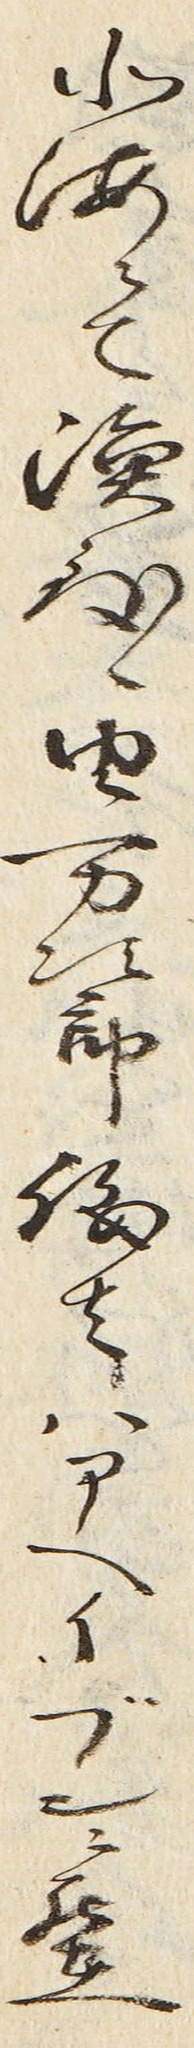北海にて漁致候由万次郎儀はハアヘイブンに罷在
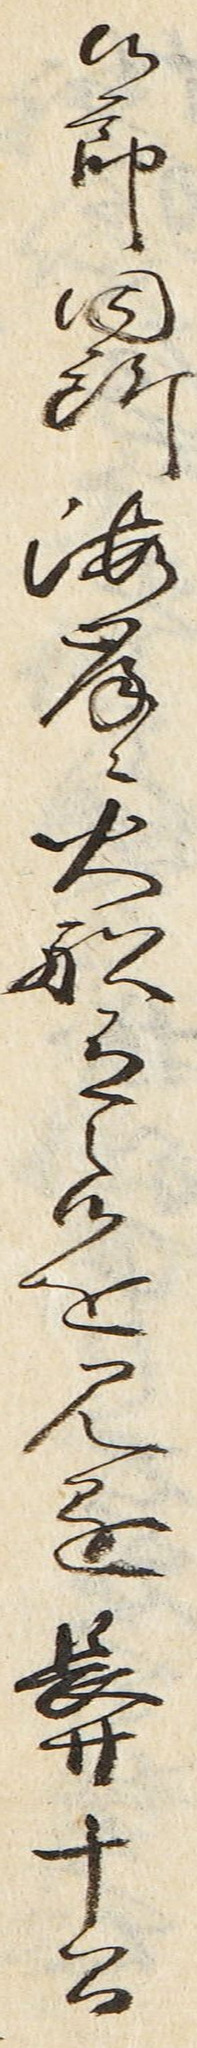候節同所海岸に火船有之候を見懸長さ十間
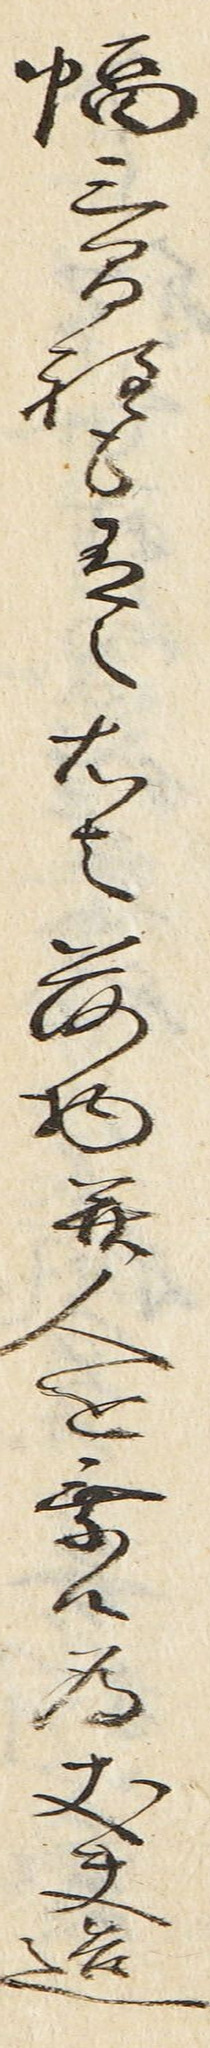幅三間程も有之右は荷物并人を乗候為丈夫造

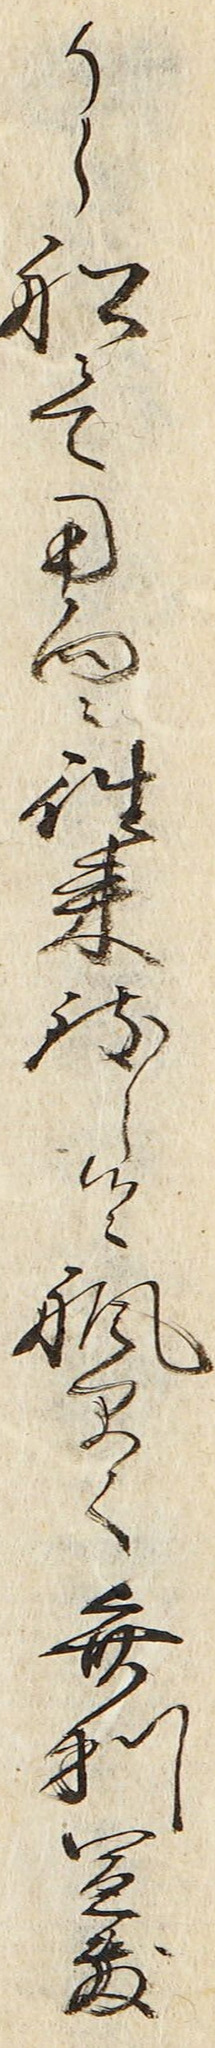り之船にて用向に往来致し候に䑺早く弁利宜敷
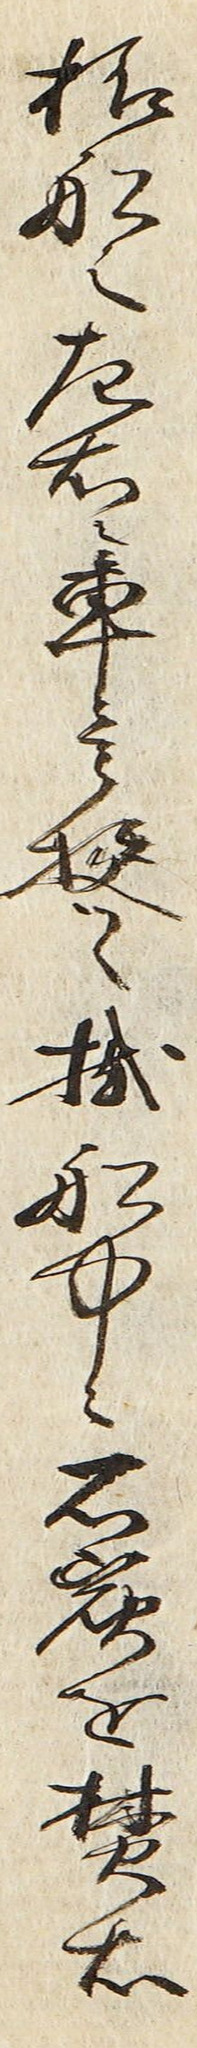様船之左右に車壱挺ツヽ掛船中に石炭を焚右
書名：土佐中浜万次郎漂流記
